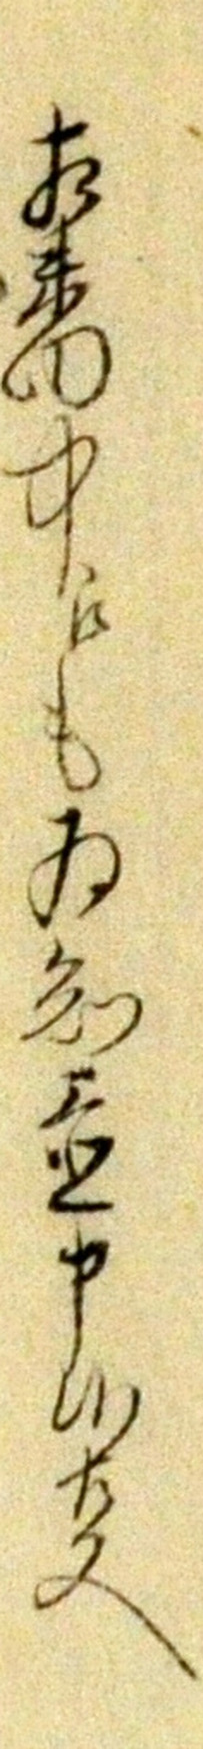相番中えも為知置申候事
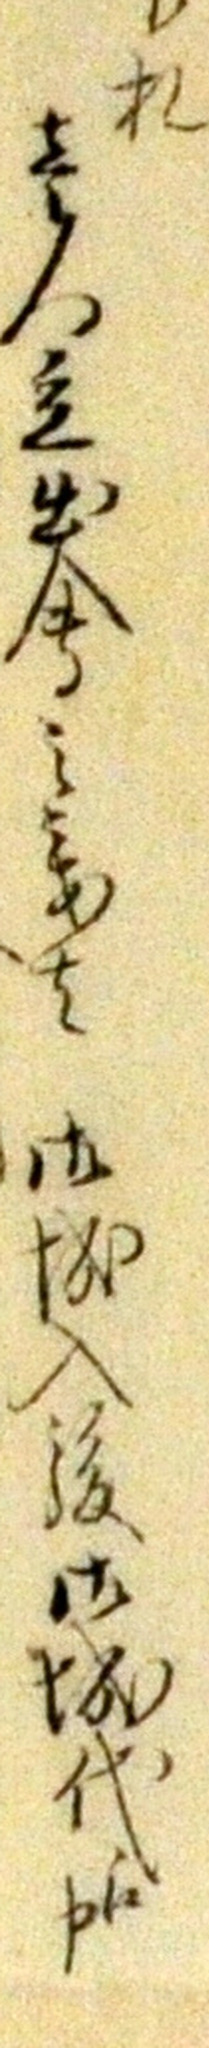壱人立出会之義者御城入後御城代え申
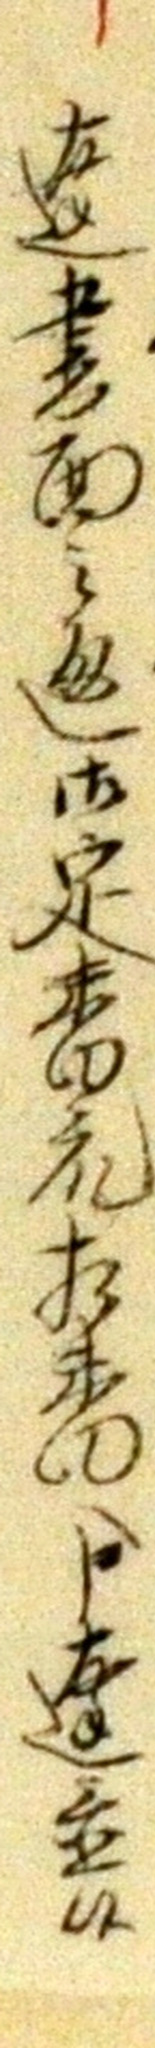達書面之通御定番衆相番へ申達置候
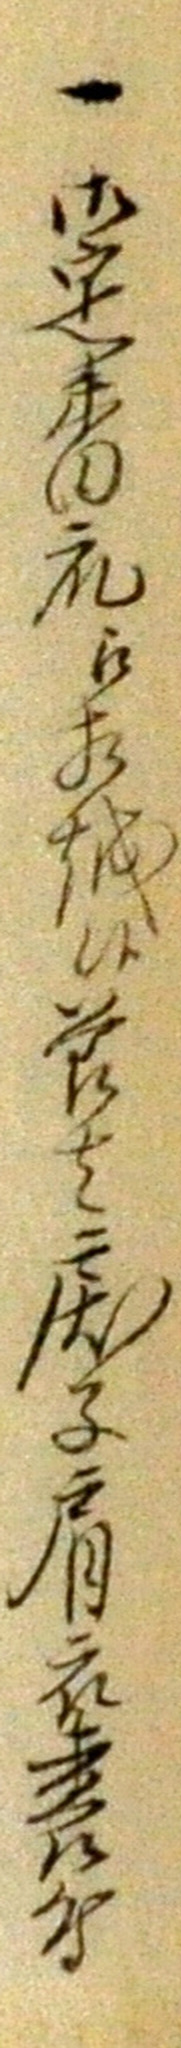一御定番衆え相越候節者戻子肩衣裏付
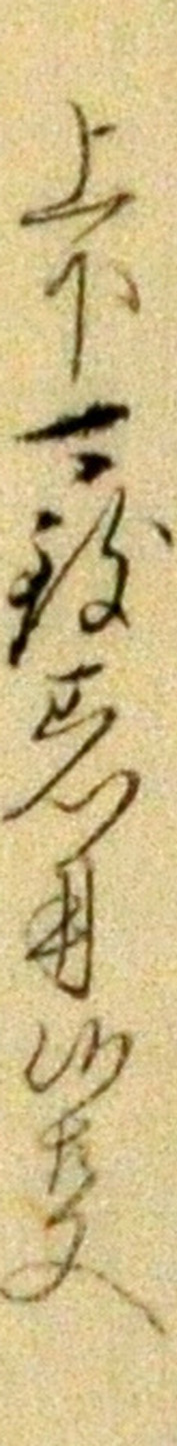上下可致着用候事
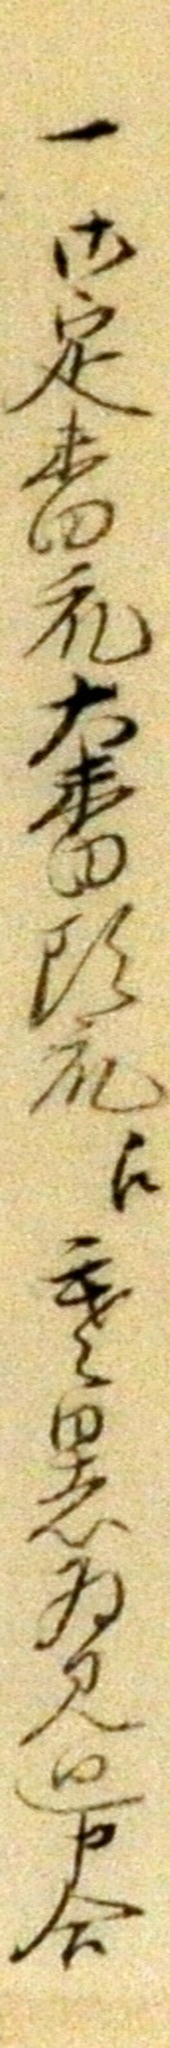一御定番衆大番頭衆え寒暑為見廻申合
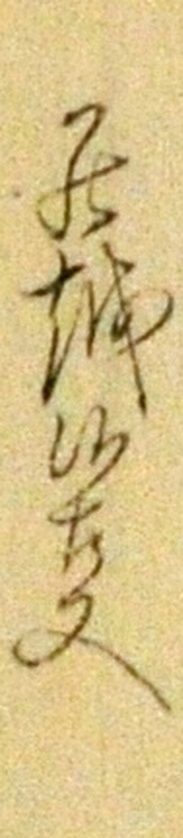罷越候事
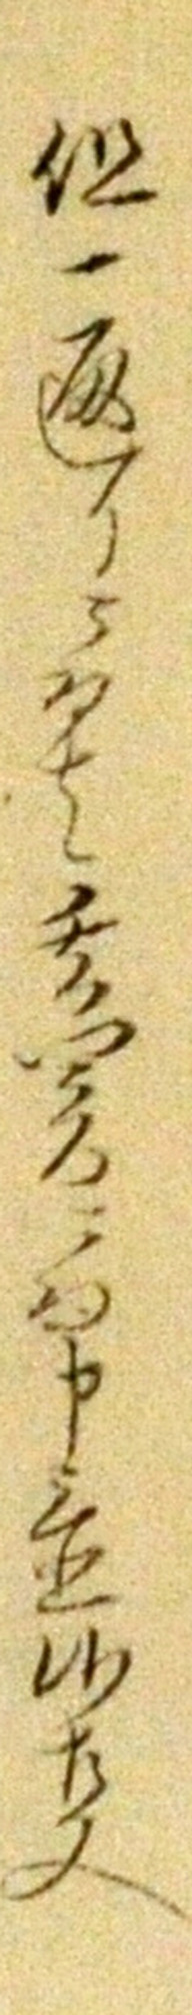但一通りニ而者玄関ニ而申置候事
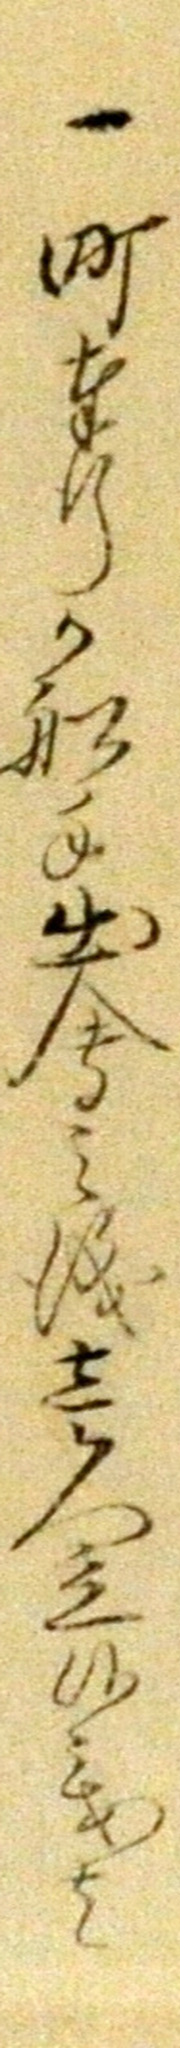一町奉行御船手出会之儀壱人立候義者
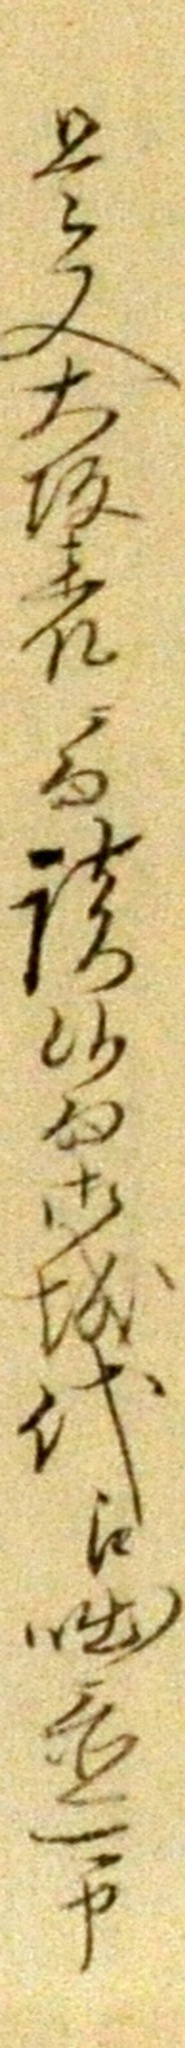是又大坂表ニ而談候而御城代え咄置可申
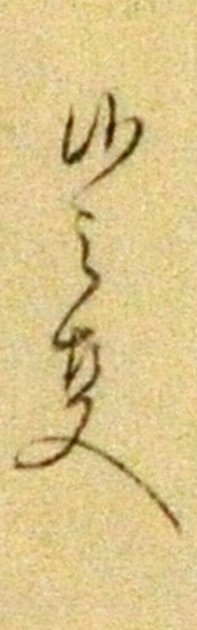候之事
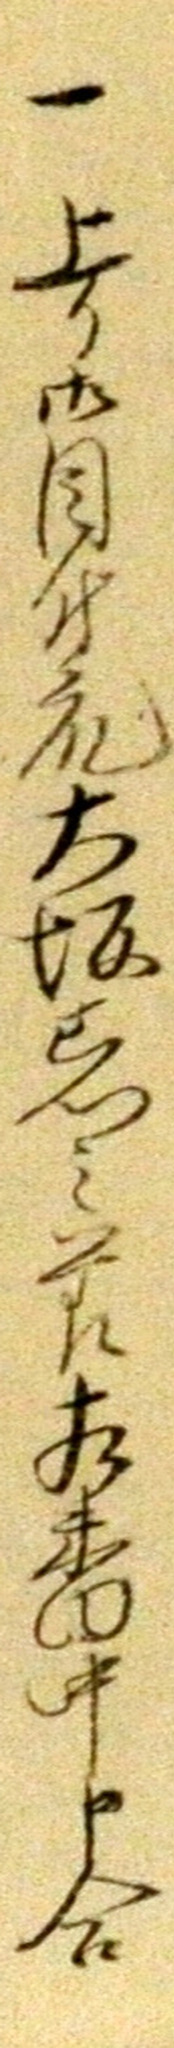一上り御目付衆大坂着之節相番中申合
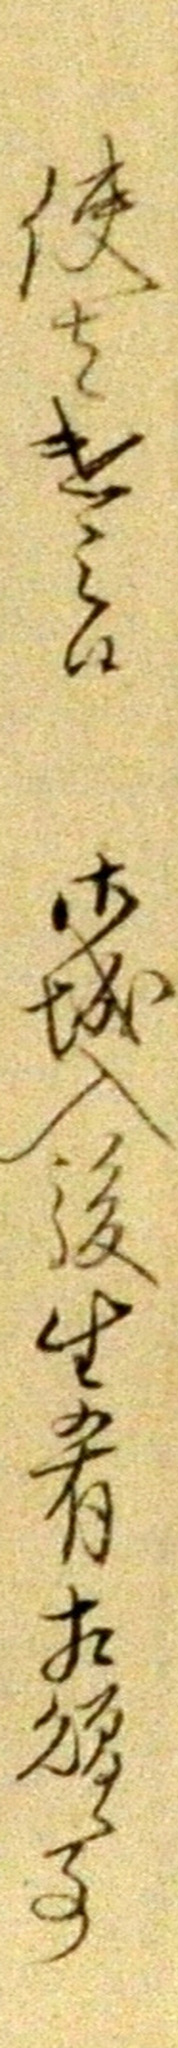使者遣し候御城入後生肴相贈候事
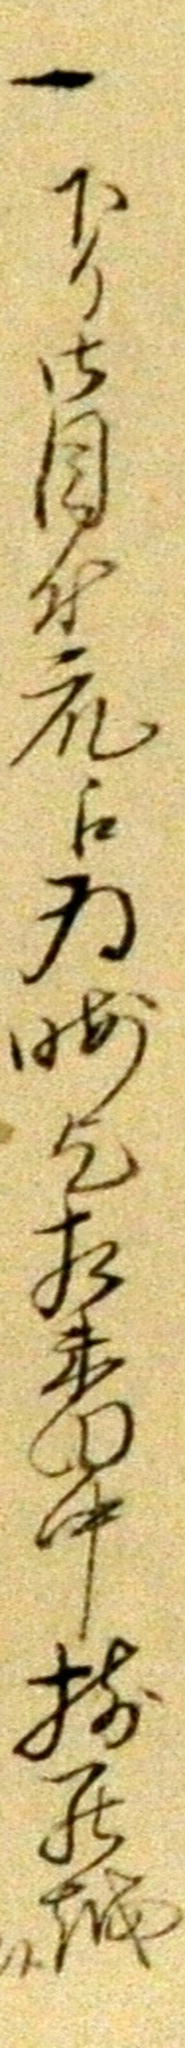一下り御目付衆え為暇乞相番中揃罷越候
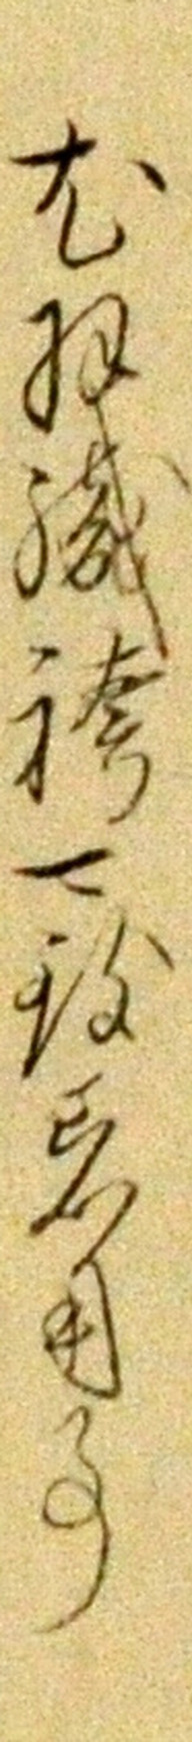尤羽織袴可致着用事
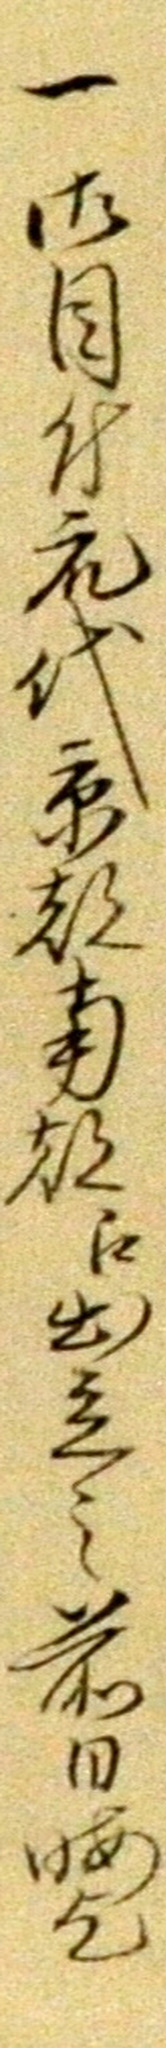一御目付衆代京都南都え出立之前日暇乞
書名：大阪加番関係諸書留〔一括〕
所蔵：伊那市立高遠町図書館・合同会社AMANE
